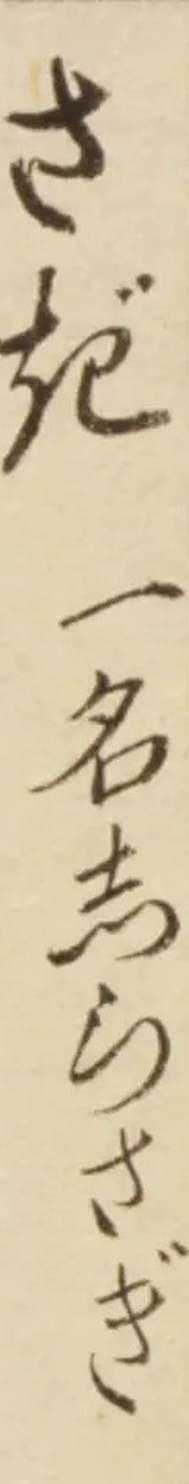さぎ一名しらさぎ
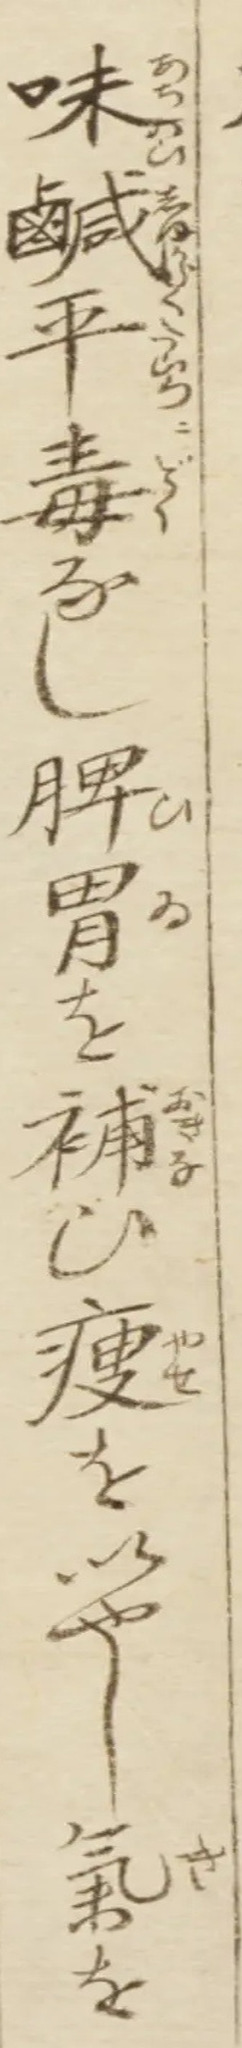味鹹平毒なし脾胃を補ひ痩をいやし気を
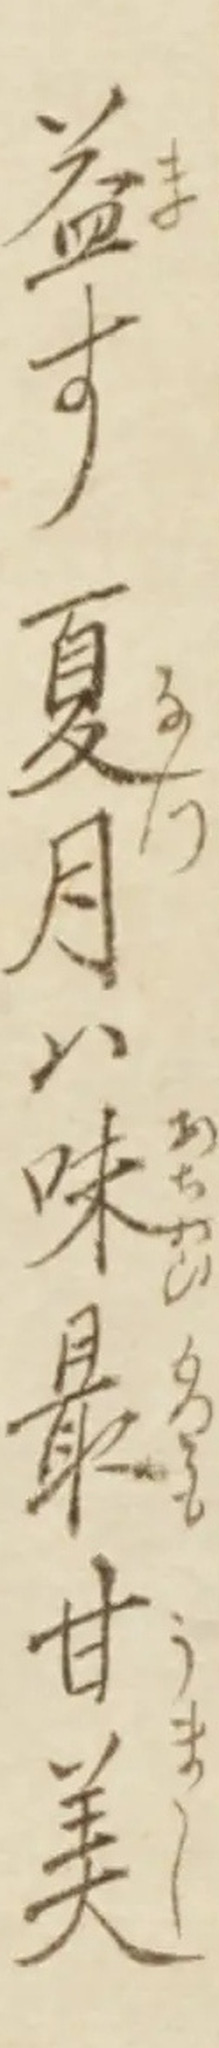益す夏月は味最甘美
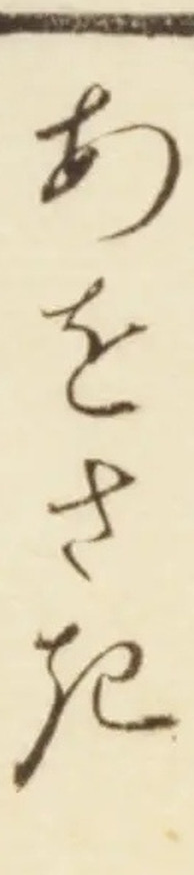あをさき

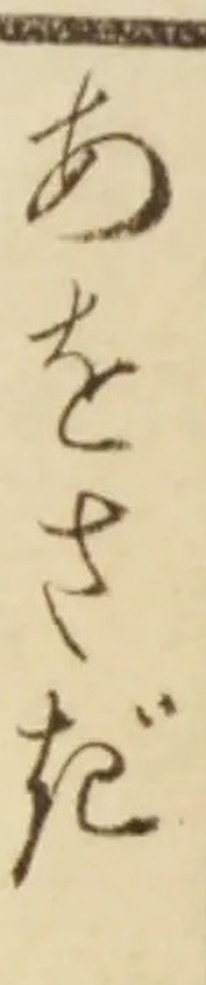あをさぎ
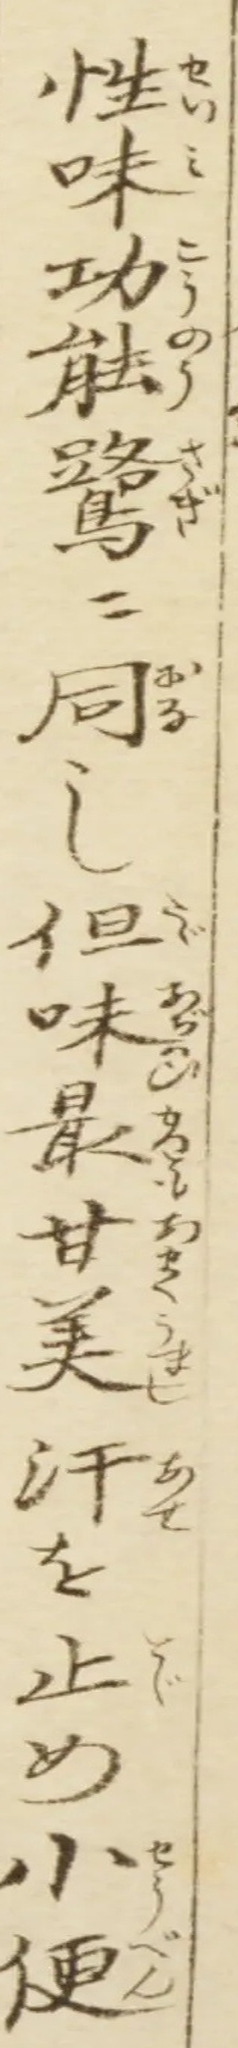性味功能鷺に同し但味最甘美汗を止め小便
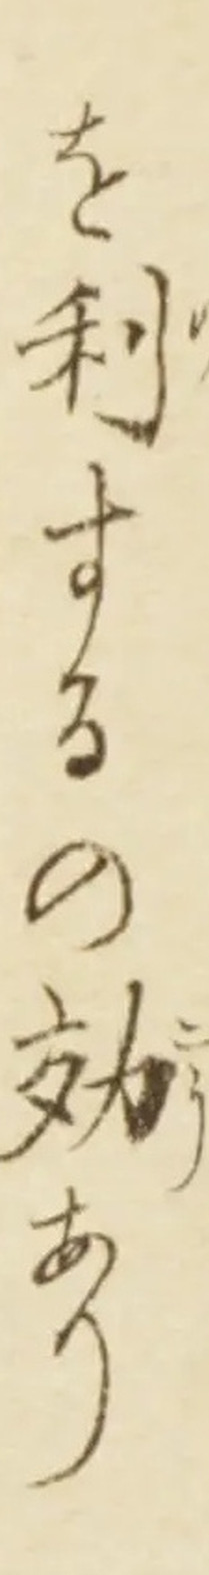を利するの効あり
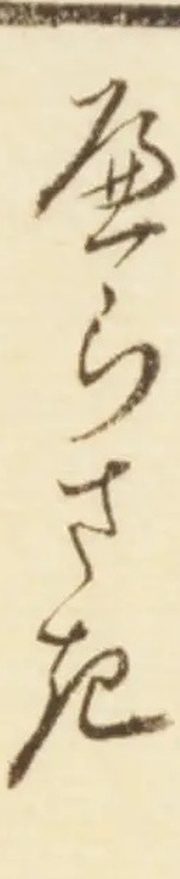へらさき

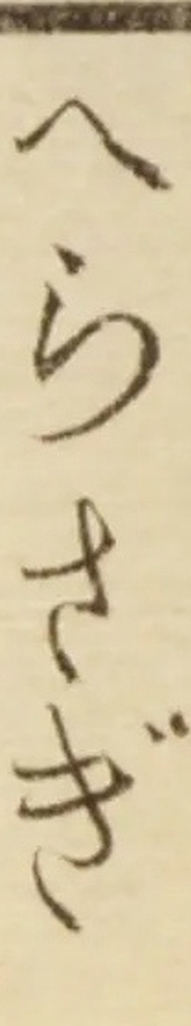へらさぎ
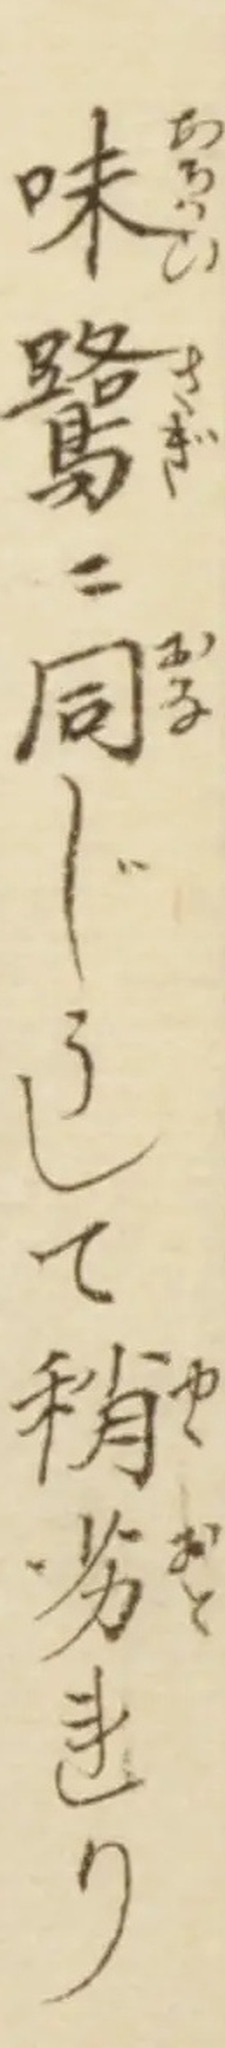味鷺に同じうして稍劣れり
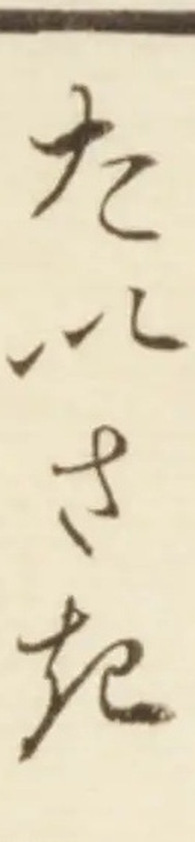たいさき

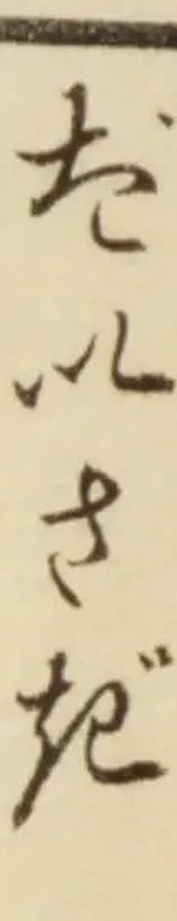だいさぎ
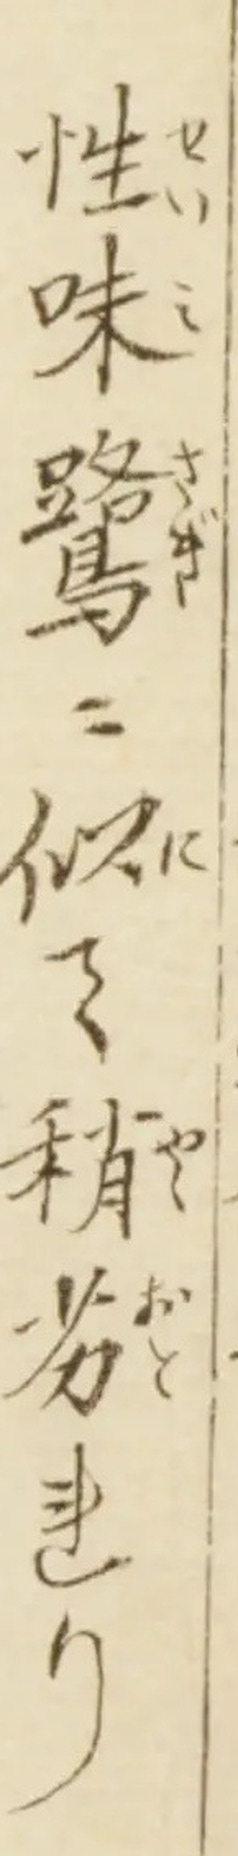性味鷺に似て稍劣れり
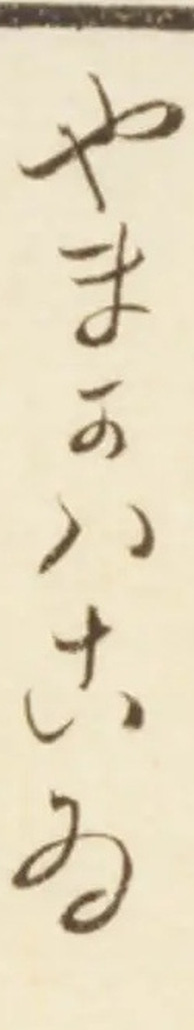やまかはこゐ

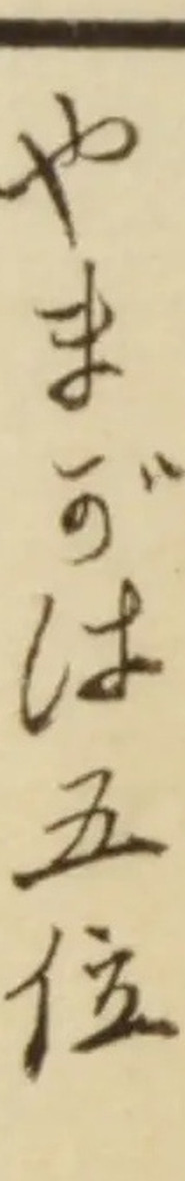やまがは五位
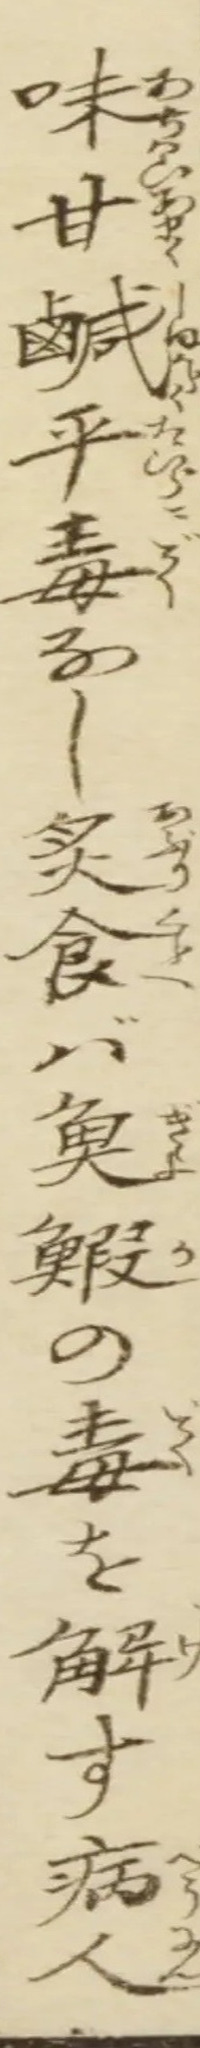味甘鹹平毒なし炙食ば魚鰕の毒を解す病人
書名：華鳥譜
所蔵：国立国会図書館 National Diet Library, JAPAN
